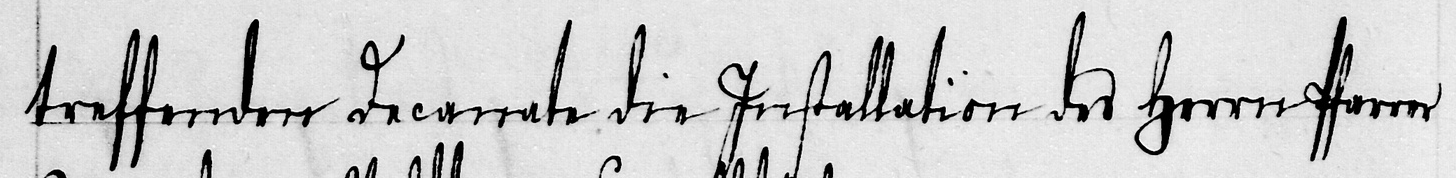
treffenden Decanate die Installation des Herrn Pfar¬
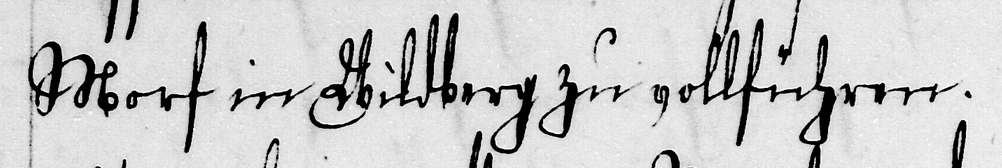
Morf in Wildberg zu vollführen.
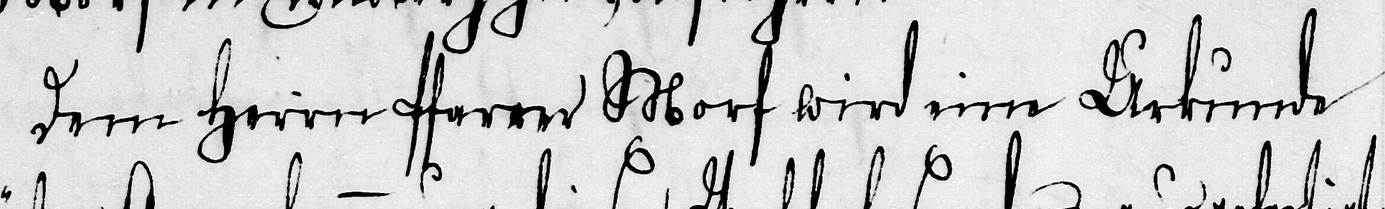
Dem Herrn Pfarrer Morf wird eine Urkunde
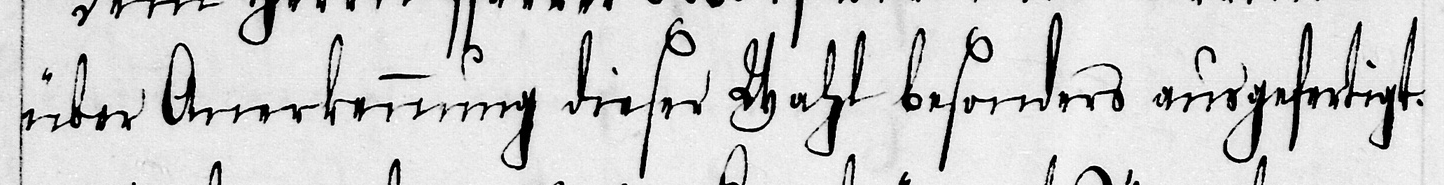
über Anerkennung dieser Wahl besonders ausgefertigt.
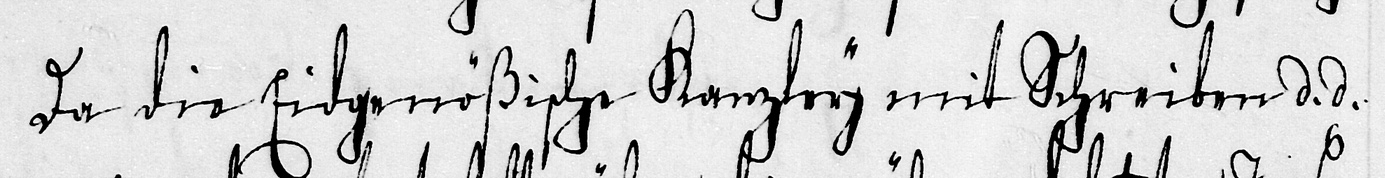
Da die Eidgenößische Kanzley mit Schreiben d. d.
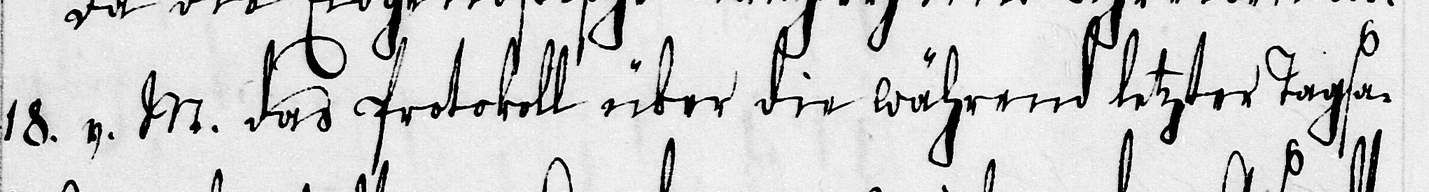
v. M. das Protokoll über die während letzter Tagsa¬
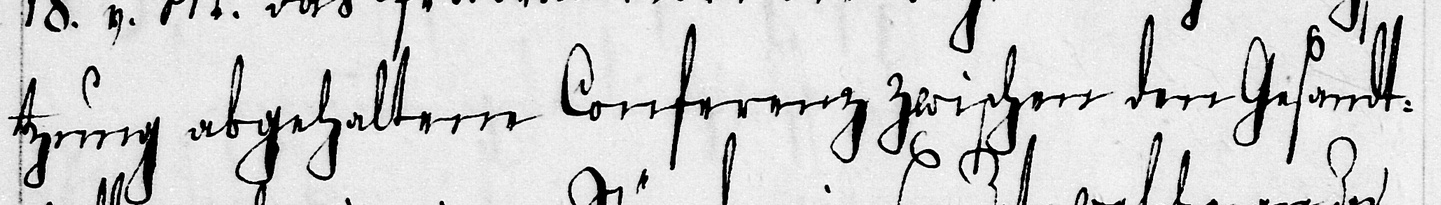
tzung abgehaltene Conferenz zwischen den Gesandt¬
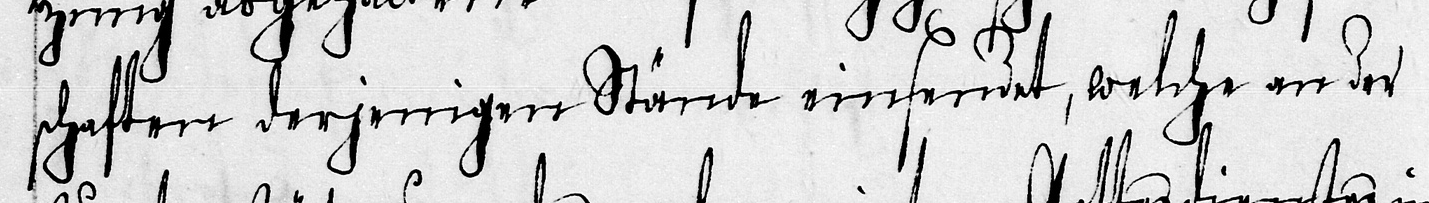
schaften derjenigen Stände einsendet, welche an der
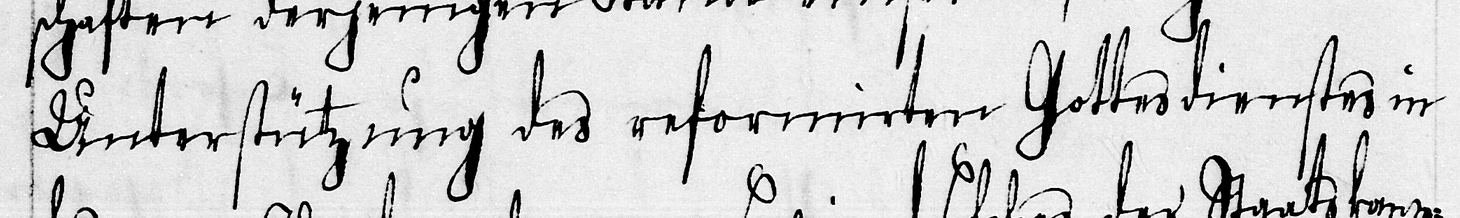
Unterstützung des reformirten Gottesdienstes in
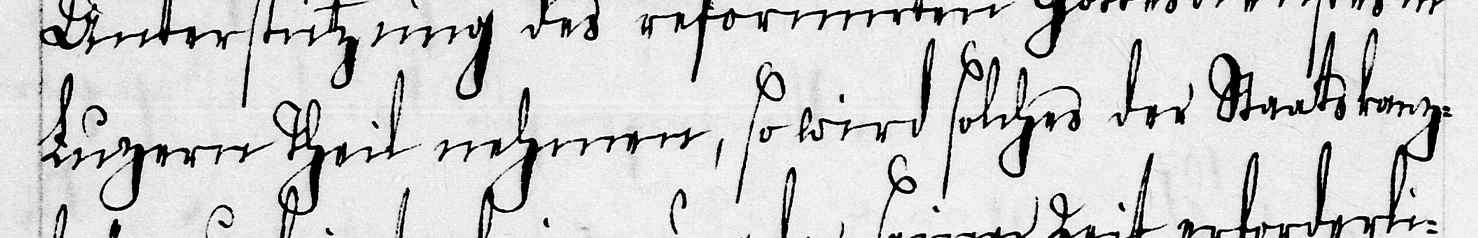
Luzern Theil nehmen, so wird solches der Staatskanz¬
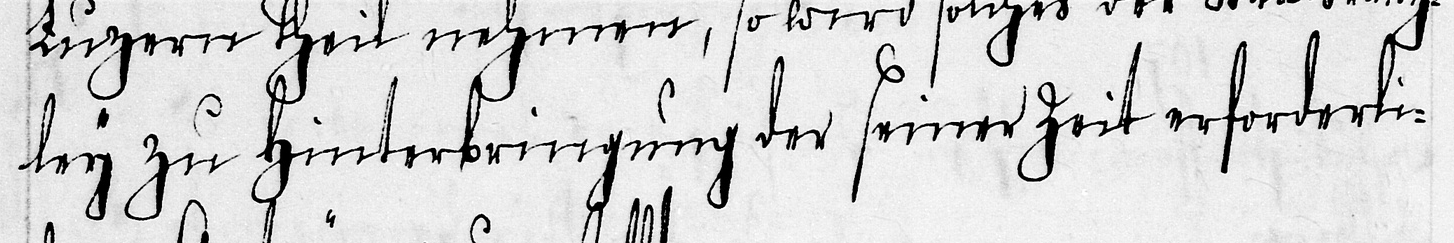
ley zu Hinterbringung der seiner Zeit erforderli¬
